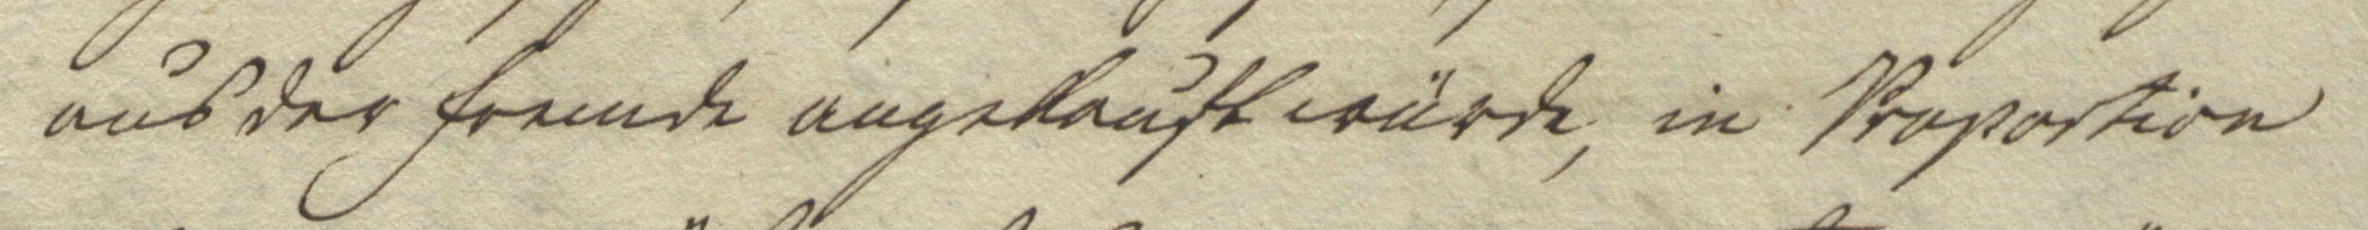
aus der Fremde angekauft würde, in Proportion
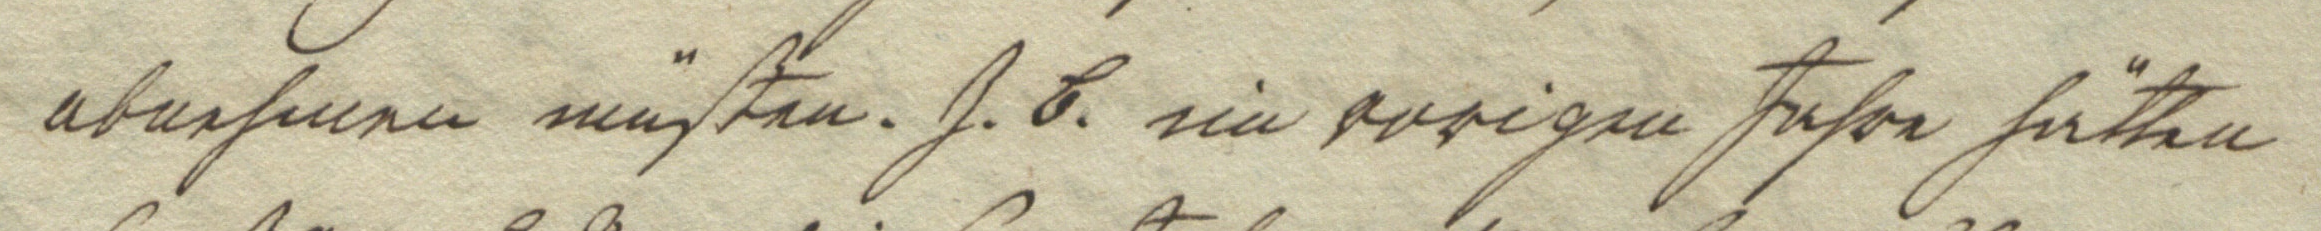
abnehmen müßten. Z. b. im vorigen Jahre hätten
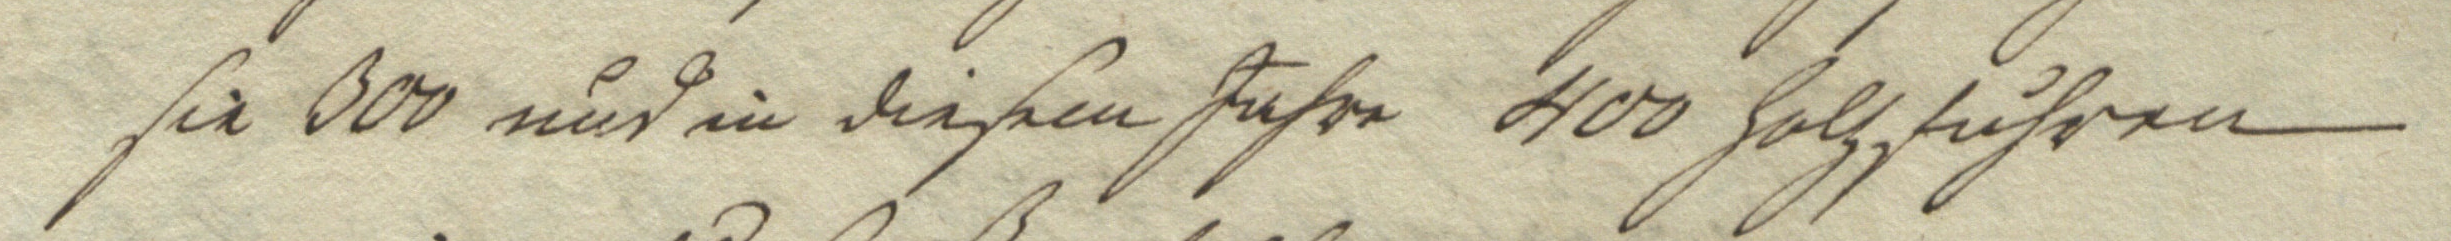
sie 300 und in diesem Jahre 400 Holzfuhren
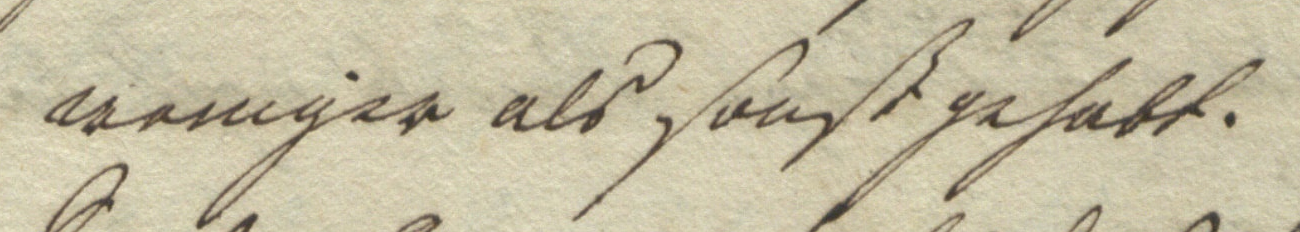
weniger als sonst gehabt.
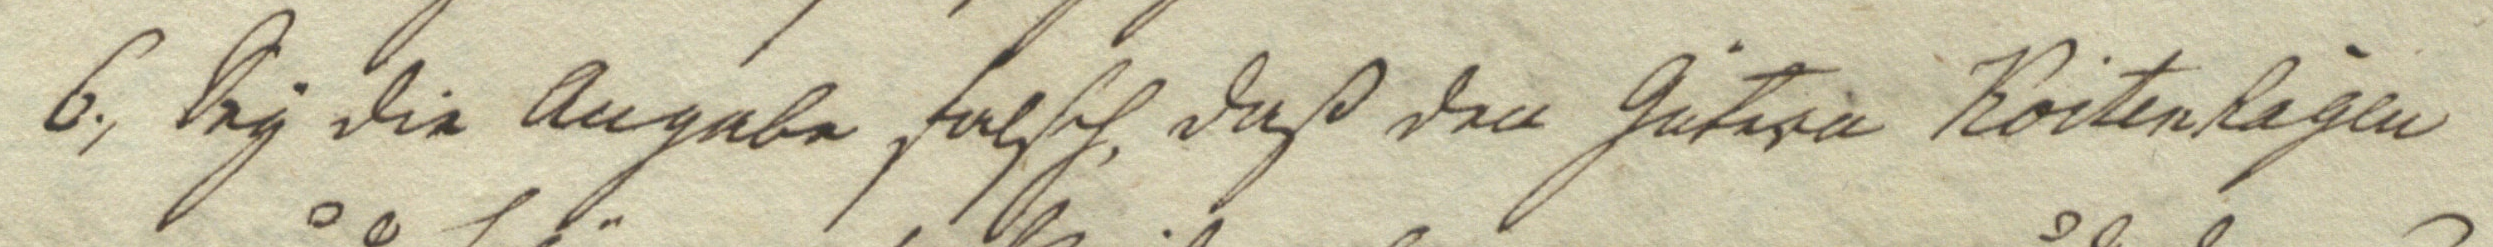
6., Sey die Angabe falsch, daß den Gütern Koitenhagen
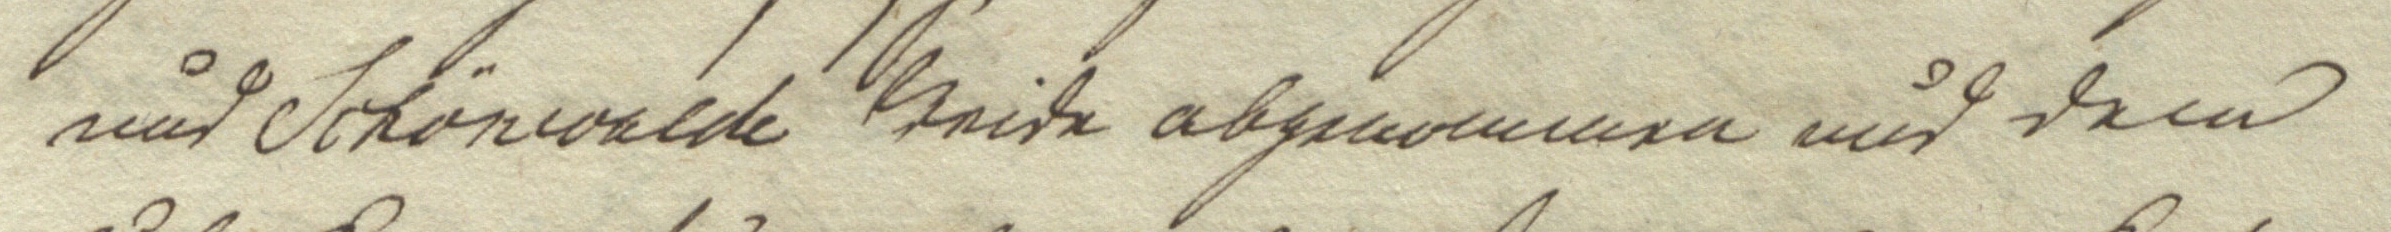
und Schönwalde Weide abgenommen und dem
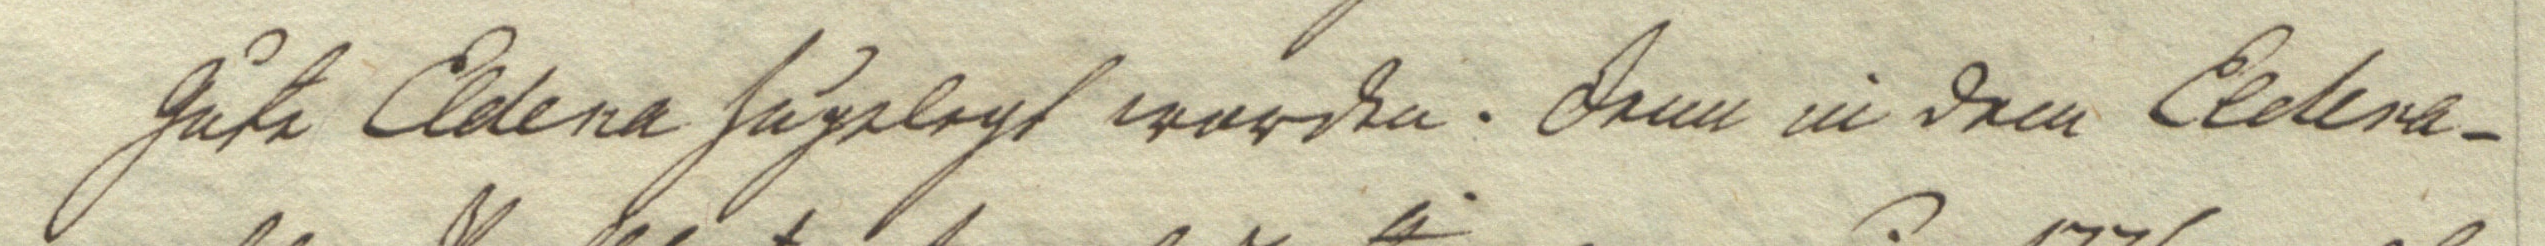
Gute Eldena zugelegt worden. Denn in dem Eldena¬
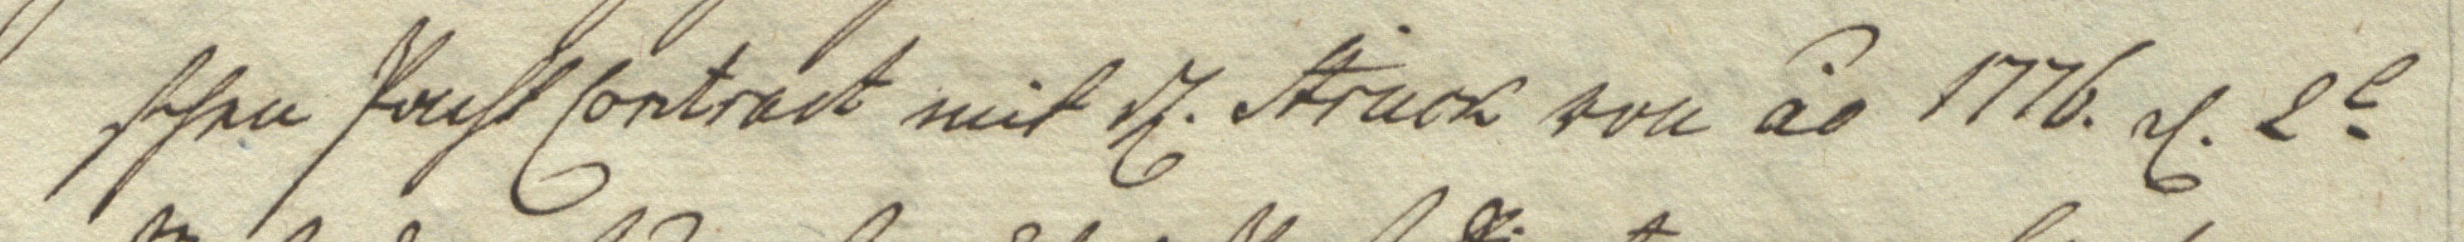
schn Pacht Contract mit dh. Struck von ao 1776 d. 2t.
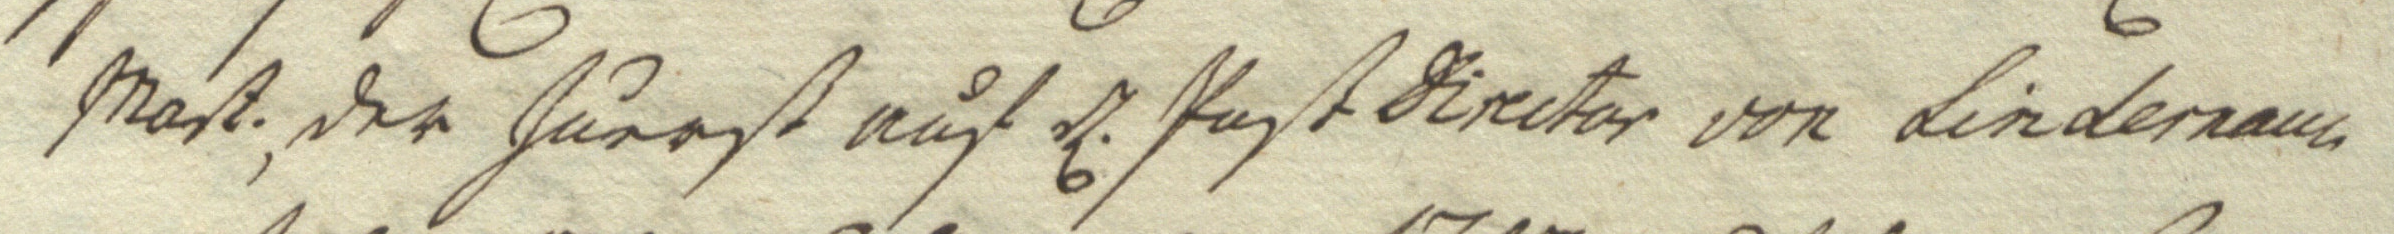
Mart., der zuerst auf dh. Post Director von Lindemann
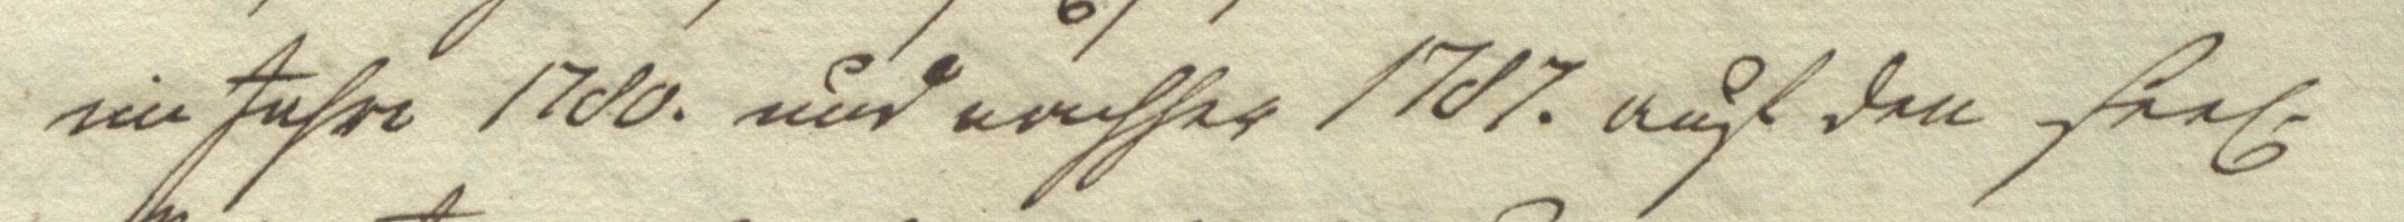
im Jahre 1780 und welcher 1787 auf den seel¬
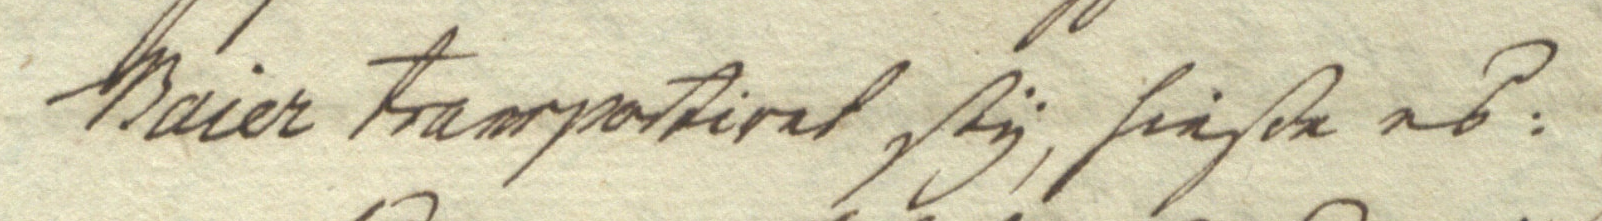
Baier transportiret sey, hieße es:
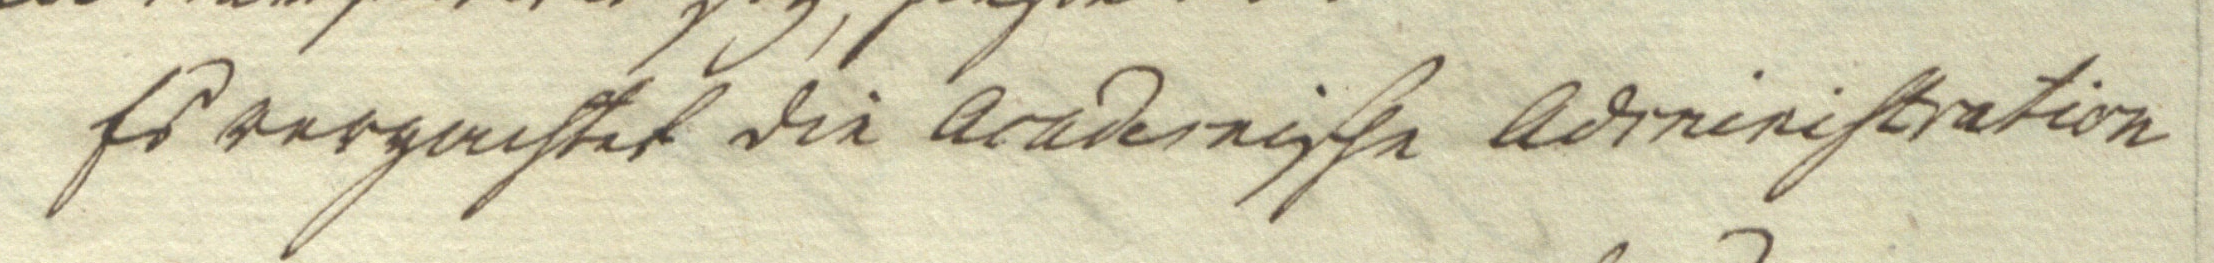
Es verpachtet die Academische Administration
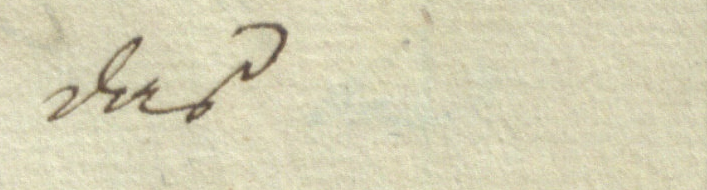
das
